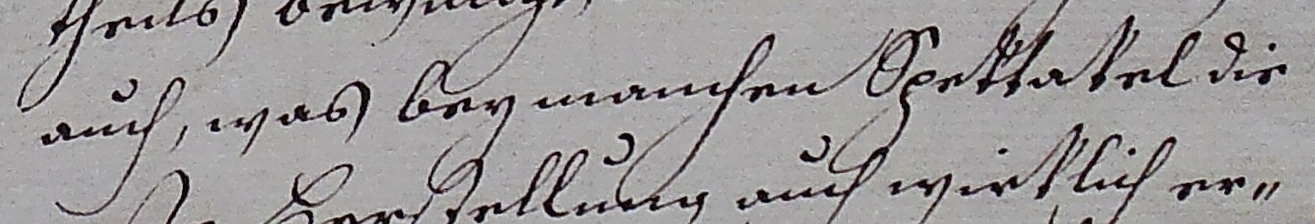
auch, was bey manchen Spektakel die
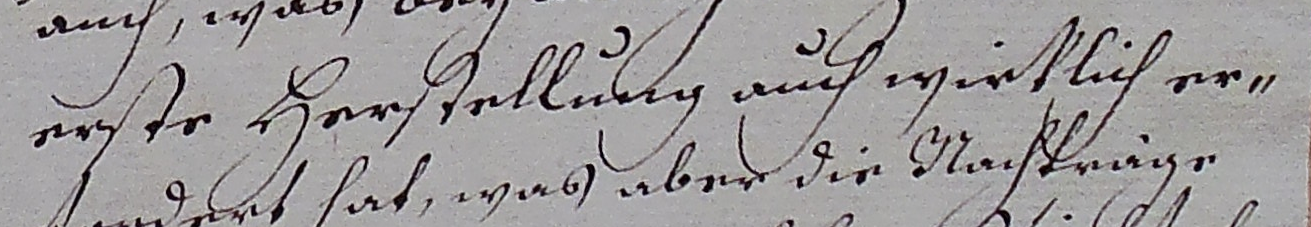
erste Herstellung auch wirklich er¬
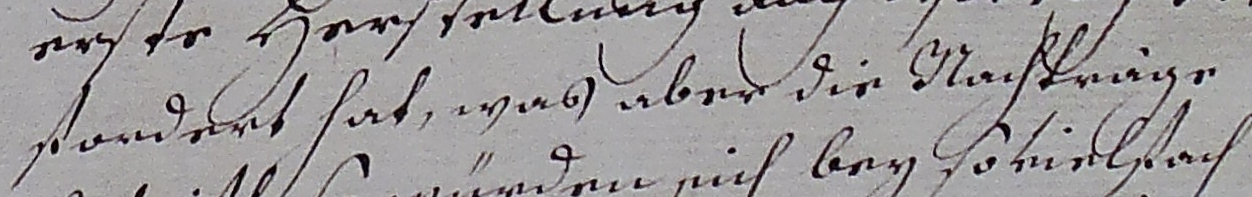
fordert hat, was aber die Nachträge
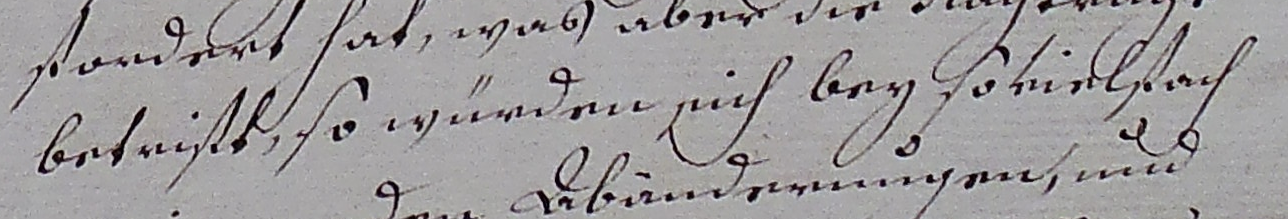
betrifft, so würden sich bey so vielfach
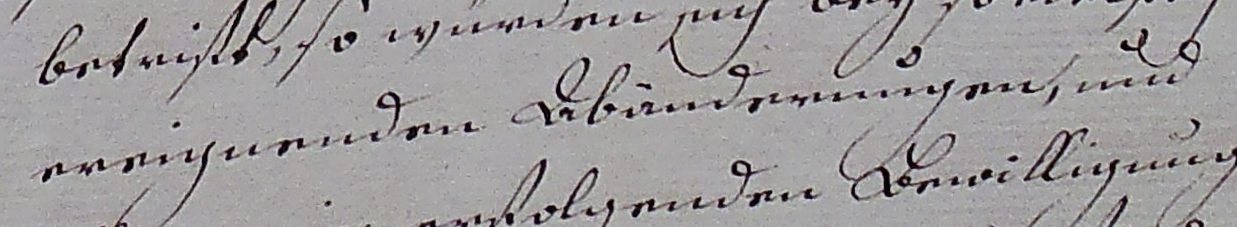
ereignenden Abänderugen, und
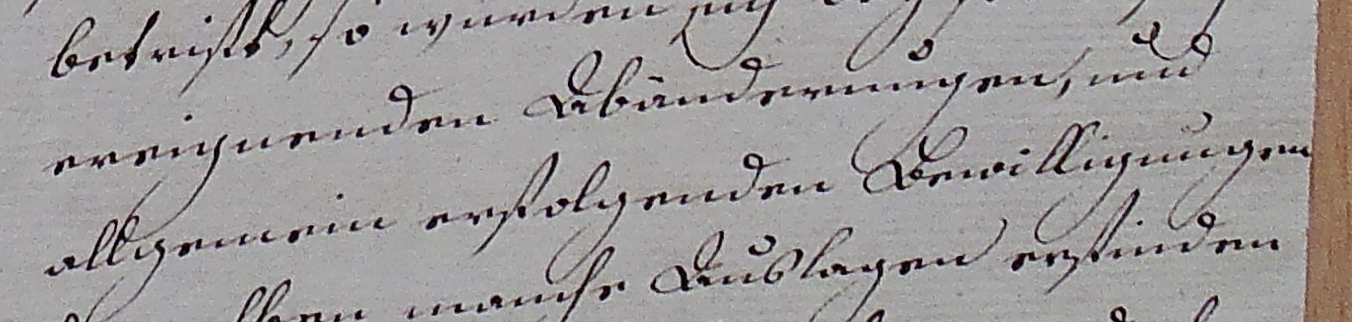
allgemein erfolgenden Bewilligungen
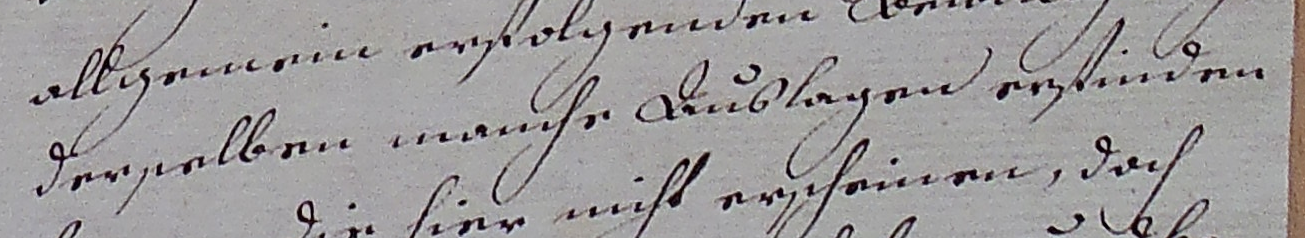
derselben manche Auslagen erfinden
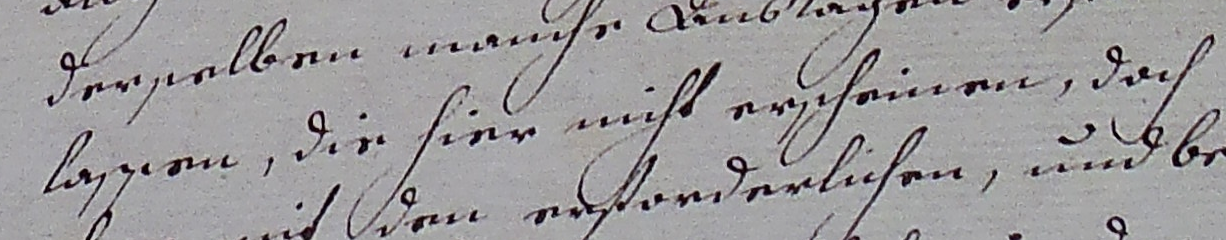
lassen, die hier nicht erscheinen, doch
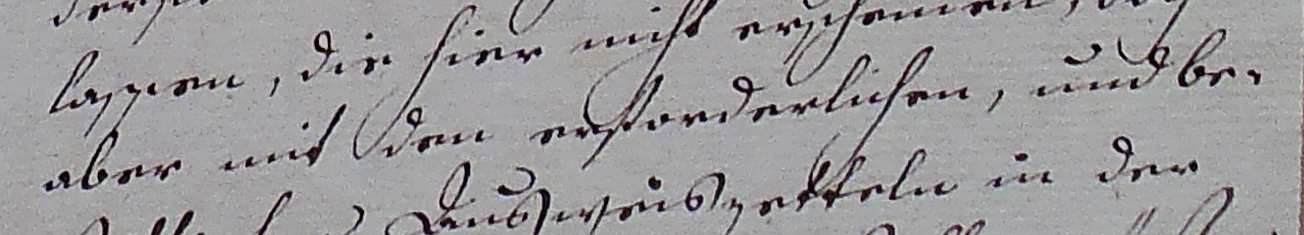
aber mit den erforderlichen, und be¬
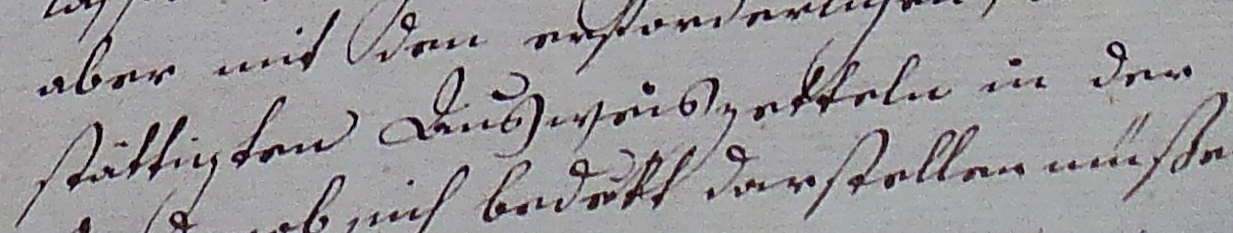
stättigten Ausweiszetteln in der
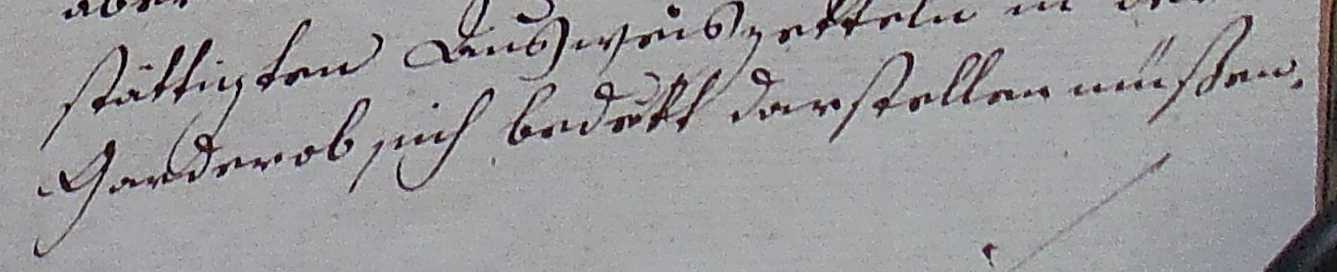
Garderob sich bedeckt darstellen müßen.
